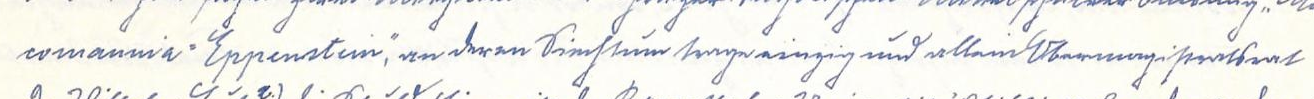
vomannia – Eppenstein“, an deren Siechtum trage einzig und allein Obermagistratsrat
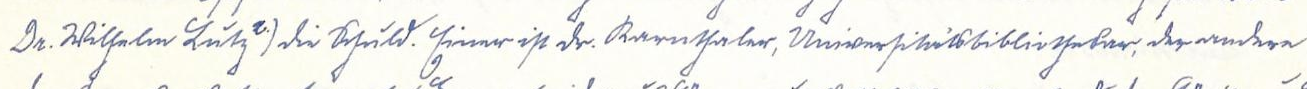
Dr. Wilhelm Lutz 2) die Schuld. Einer ist Dr. Karnthaler, Universitätsbibliothekar, der andere
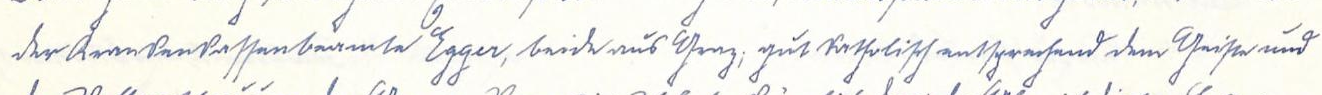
der Krankenkassenbeamte Egger, beide aus Graz, gut katholisch entsprechend dem Geiste und
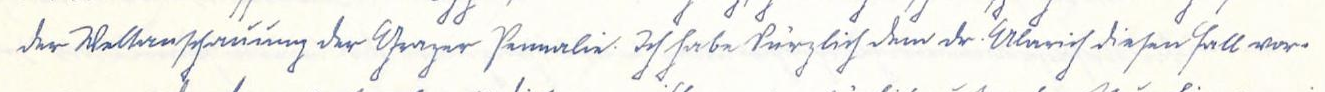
der Weltanschauung der Grazer Pennalie. Ich habe kürzlich dem Dr. Alarich diesen Fall vor-
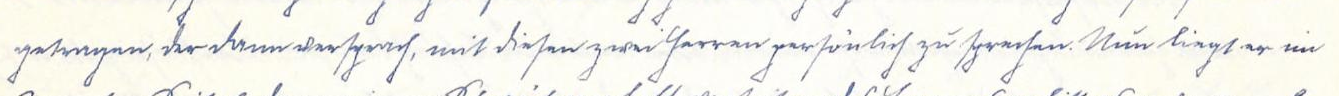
getragen, der dann versprach, mit diesen zwei Herren persönlich zu sprechen. Nun liegt er im
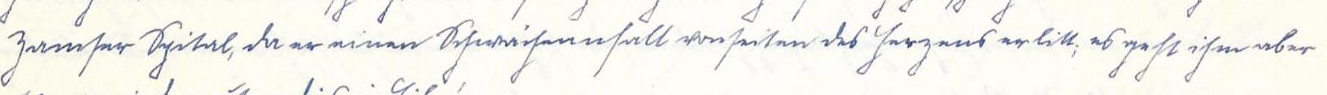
Zamser Spital, da er einen Schwächeanfall vonseiten des Herzens erlitt, es geht ihm aber
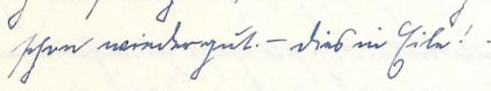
schon wieder gut.-Dies in Eile!
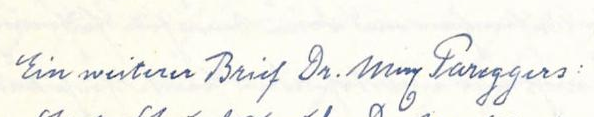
Ein weiterer Brief Dr. Max Pariggers
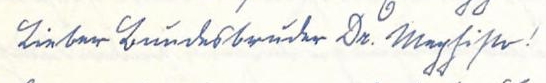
Liebe Bundesbrüder Dr. Mephisto!
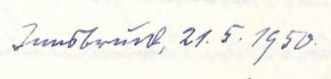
Innsbruck 21.5.1950
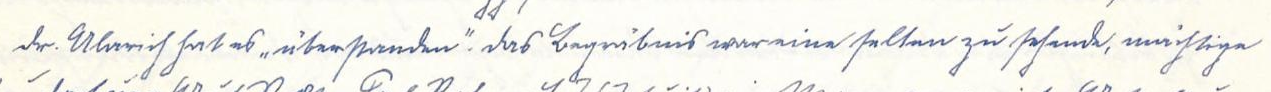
Dr. Alarich hat es „überstanden“. Das Begräbnis war eine selten zu sehende, mächtige
